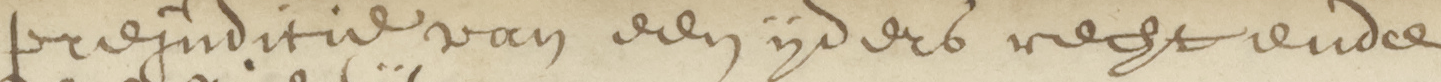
prejuditie van een ijders recht ende
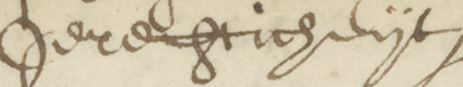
gerechticheijt.
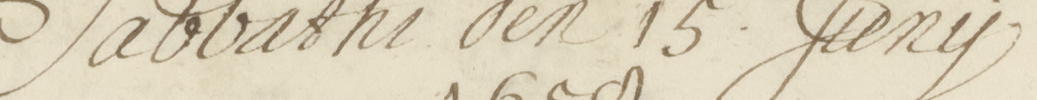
Sabbathi den 15.en Junij
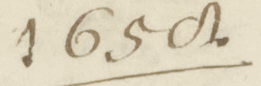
1658
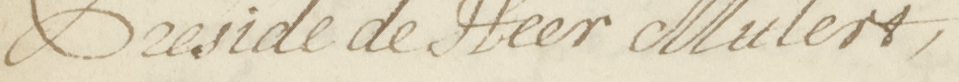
Preside de Heer Mulert,
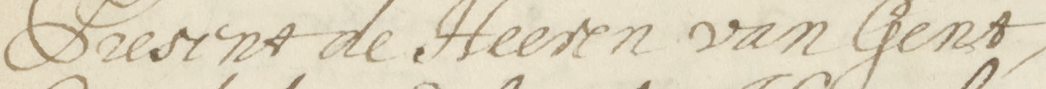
Present de Heeren van Gent,
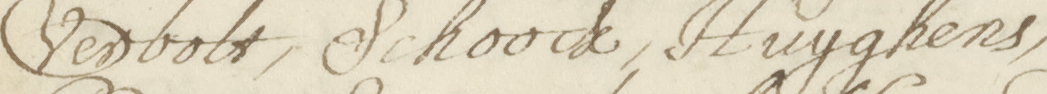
Verbolt, Schoock, Huyghens,
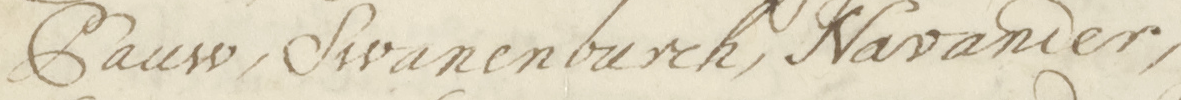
Gauss, Swanenburch, Navander,
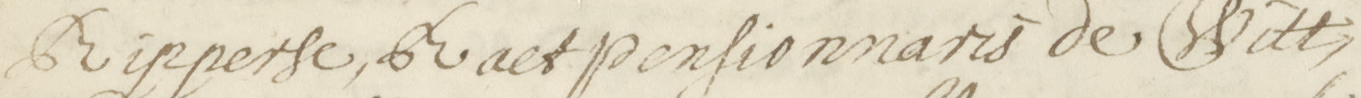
Ripperse, Raetpensionnaris de Witt,
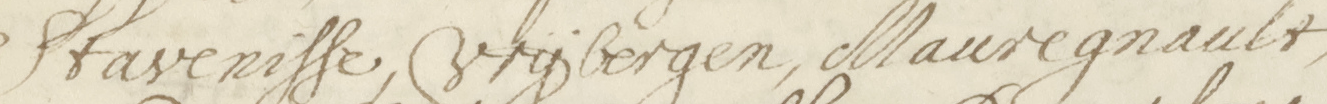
Stavenisse, Vrijbergen, Mauregnault,
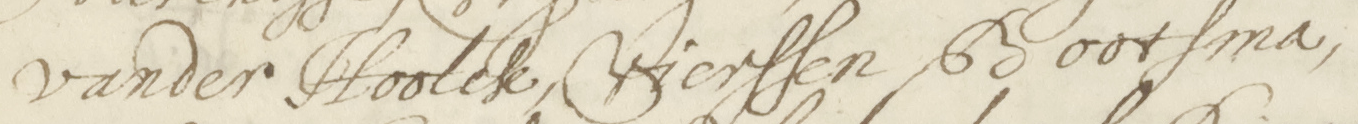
vander Hoolck, Vierssen, Bootsma,
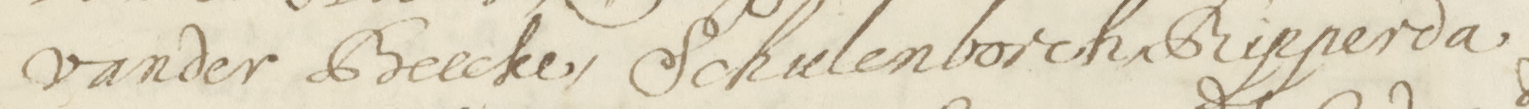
vander Beecken, Schulenborch, Ripperda,
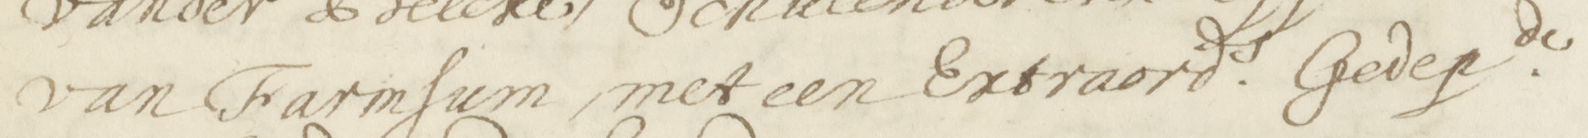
van Farmsum, met een Extraords. Gedepde.
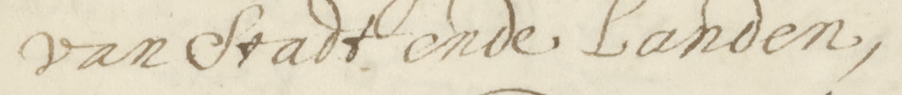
van Stadt ende Landen.
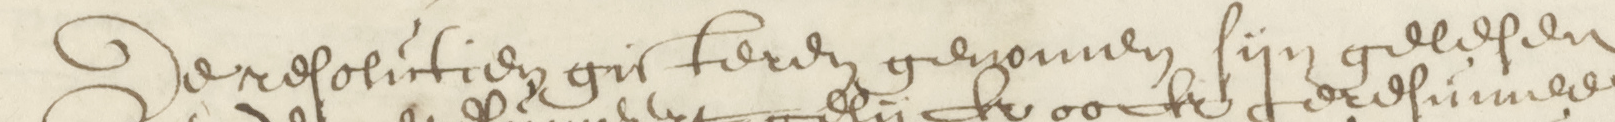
De resolutien gisteren genomen sijn gelesen
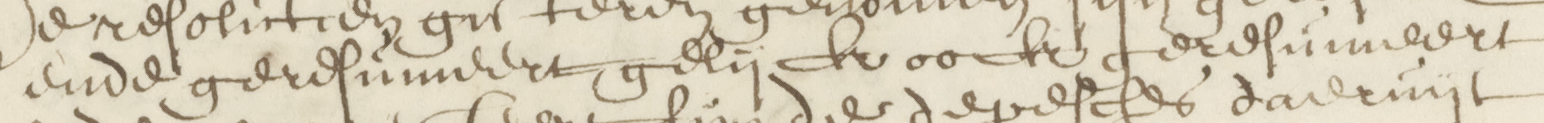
ende geresumeert gelijck oock geresumeert
